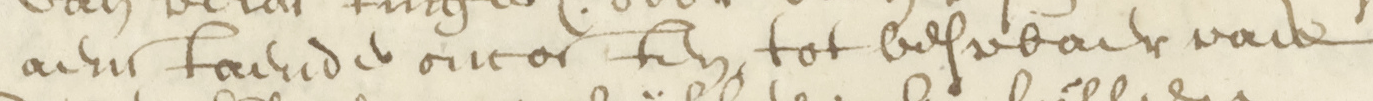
aenstaende oncosten, tot beswaer van
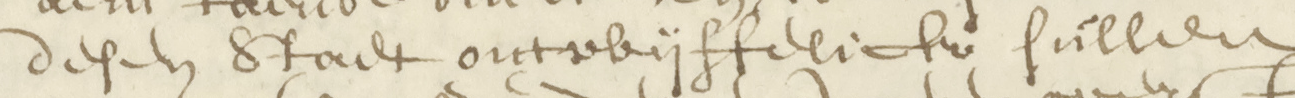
desen Staet ontwijffelick sullen
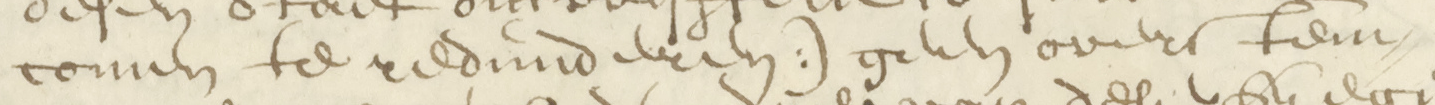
comen te redunderen :) geen overstem,,
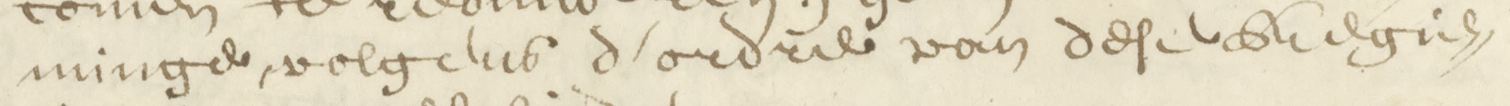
minge, volgens d‛ordre van dese Regie„
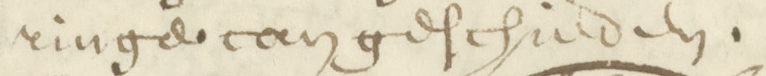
ringe can geschieden.
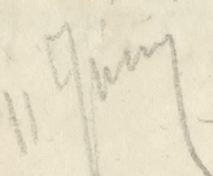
11 Junij
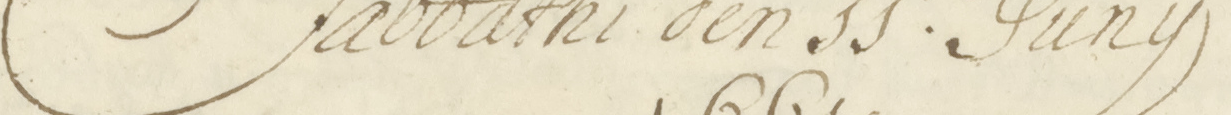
Sabbathi den 11en Junij
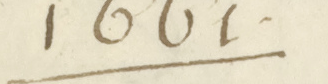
1661
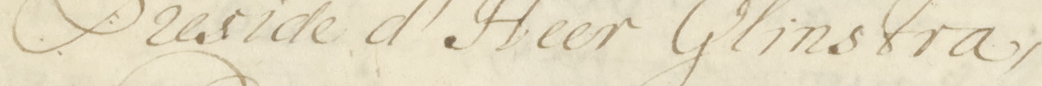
Preside d‛ Heer Glinstra,
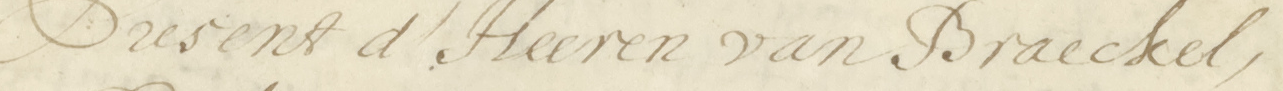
Present d' Heeren van Braeckel,
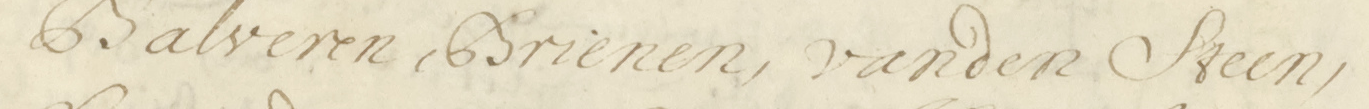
Balveren, Brienen, van den Steen,
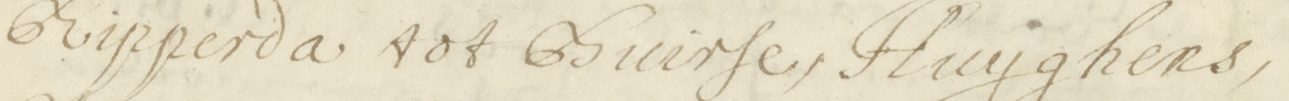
Ripperda tot Buirse, Huijghens,
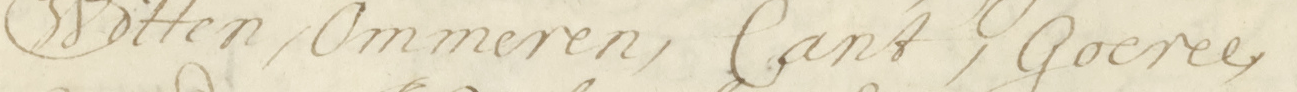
Witten, Ommeren, Cant, Goeree,
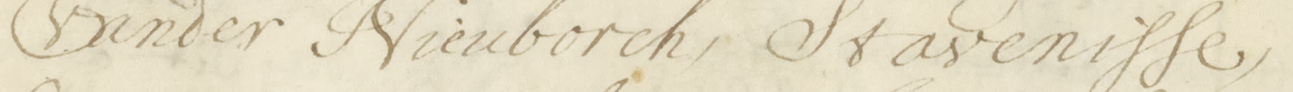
vander Nieuborch, Stavenisse,
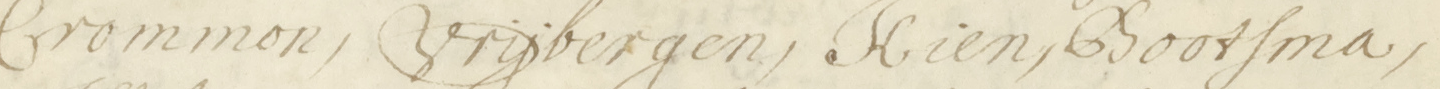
Crommon, Vrijbergen, Kien, Bootsma,
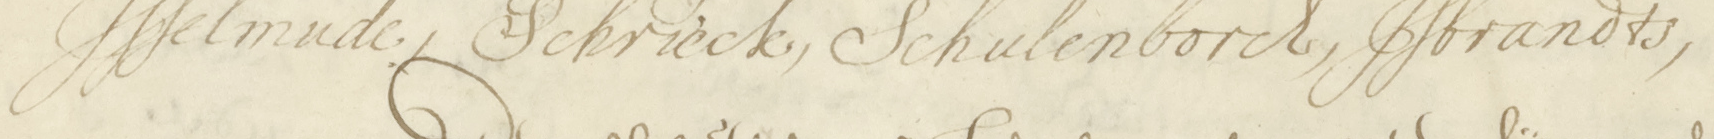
Isselmude, Schrieck, Schulenborch, Isbrandts.
